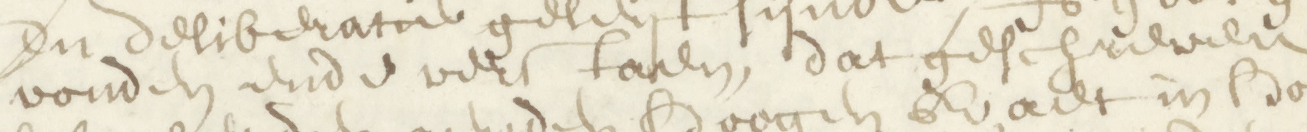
vonden ende verstaen, dat geschreven
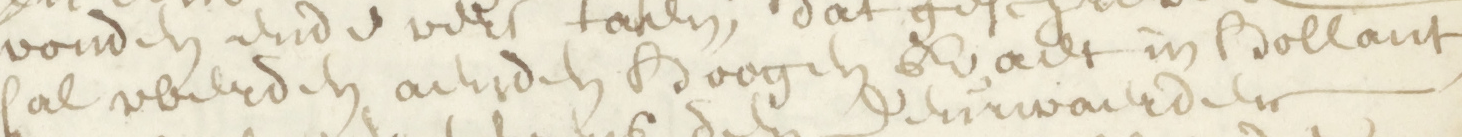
sal werden aenden Hoogen Raet in Hollant
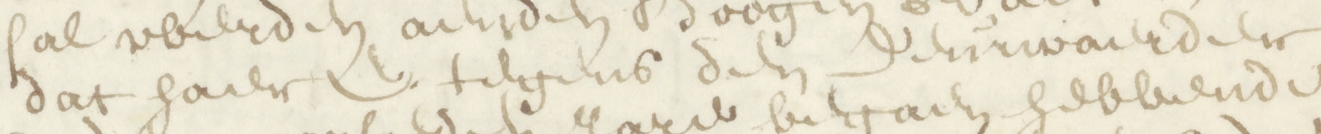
dat haer E. tegens den deurwaerder
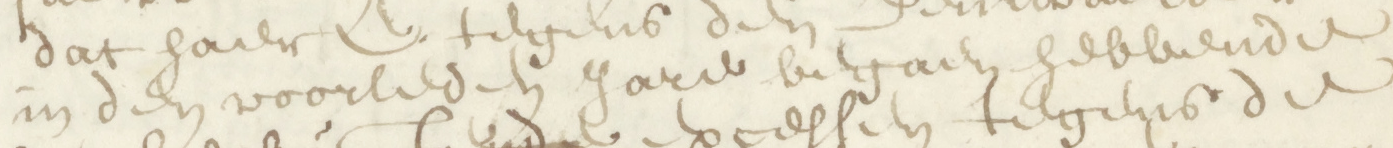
in den voorleden jare begaen hebbende
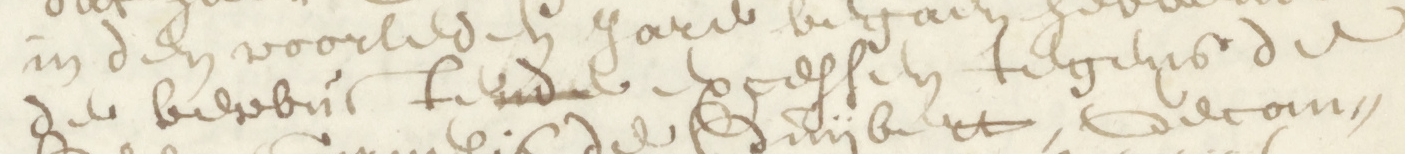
de bewustende excessen tegens de
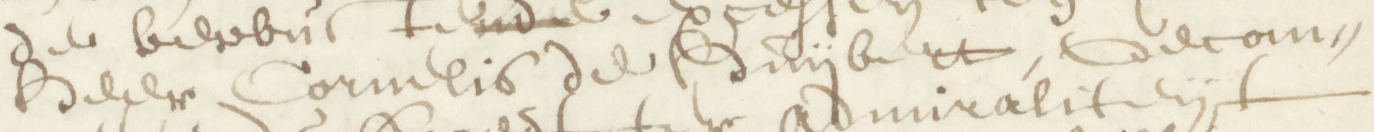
Heer Cornelis de Huijbert, Gecom„
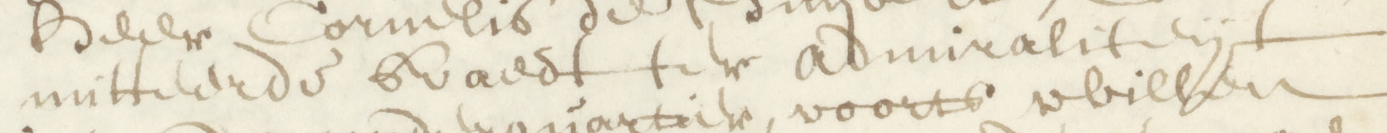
mitteerde Raedt ter Admiraliteijt
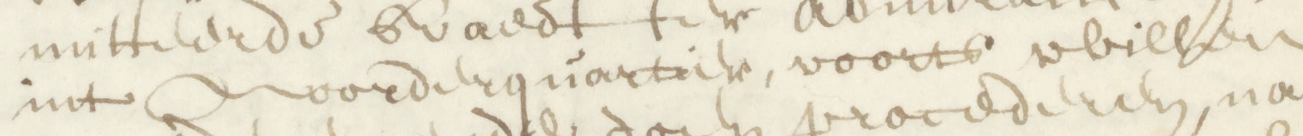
int Noorderquartier, voorts willen
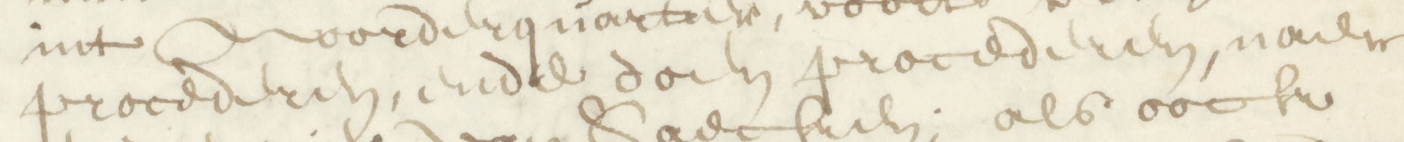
procederen, ende doen procederen, naer
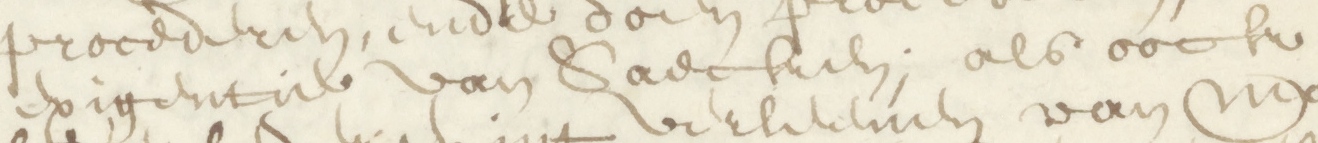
exigentie van Saecken; als oock
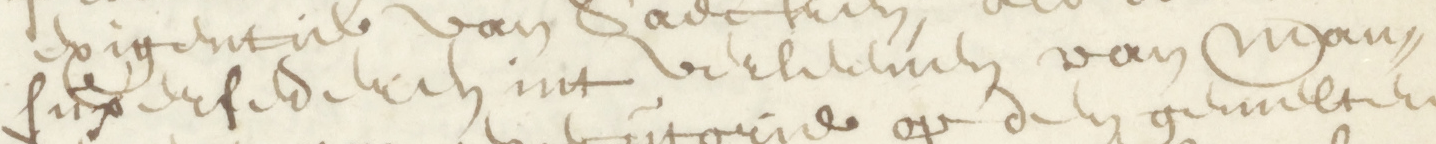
supersederen int verleenen van man,,
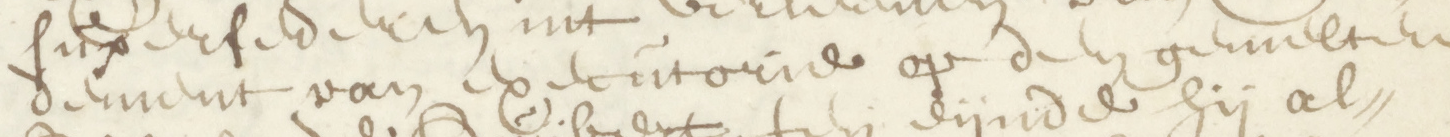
dement van executorie op den gemelten
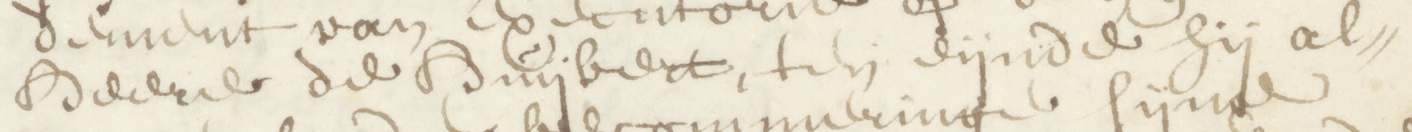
Heere de Huijbert, ten eijnde hij al„
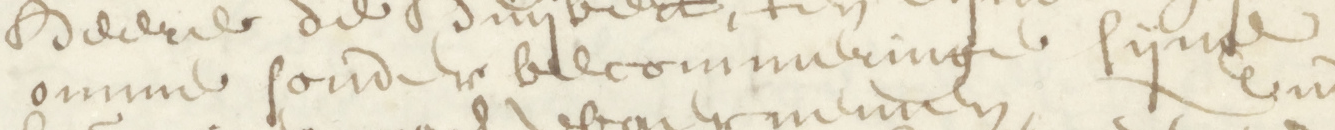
omme sonder becommeringe sijne
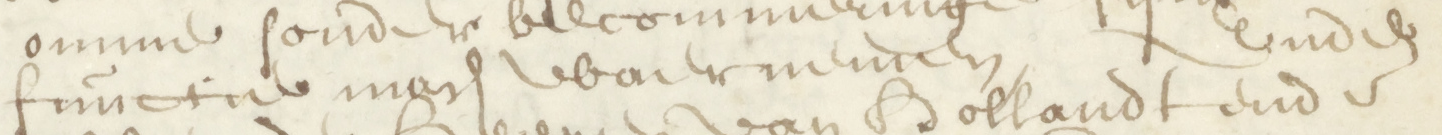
functie mach waernemen ende
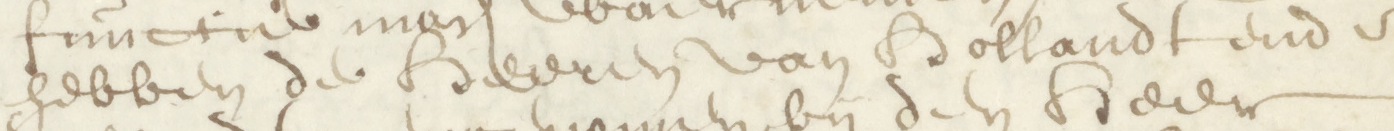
hebben de Heeren van Hollandt ende
